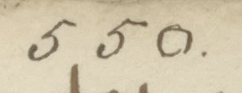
550.
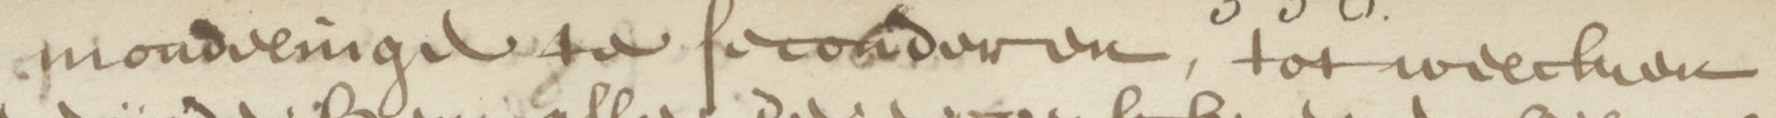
mondelinge te seconderen, tot welcken
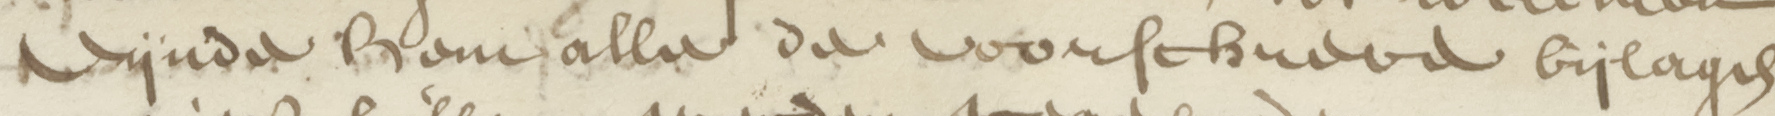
Eijnde Hem alle de voorschreve bijlagen
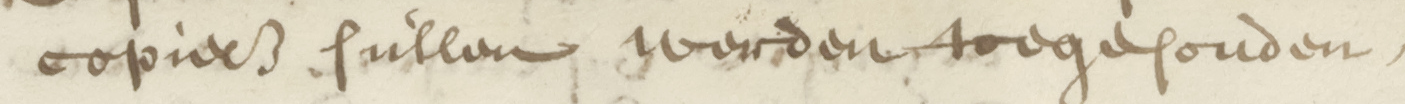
copiel sullen werden toegesonden.
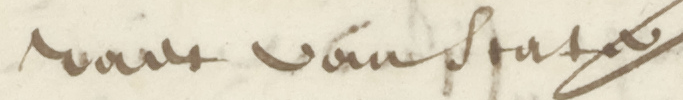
raet van State
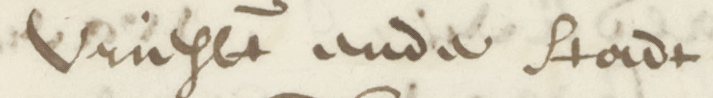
Vrieslt ende Stadt
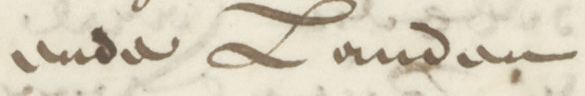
ende Landen
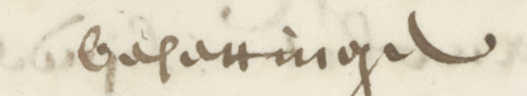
besettinge
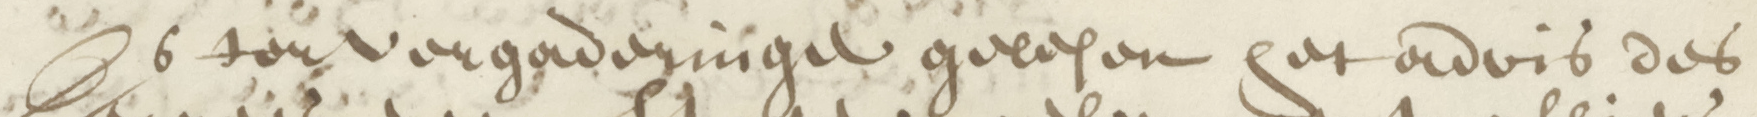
Is ter vergaderinge gelesen het advis des
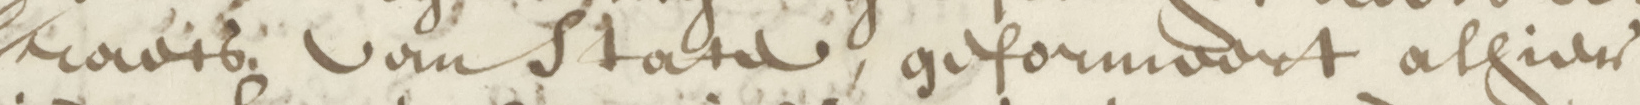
raets van State, geformeert alhier
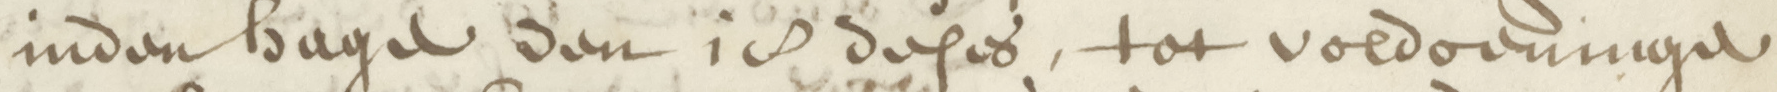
inden hage den 18 deses, tot voldoeninge
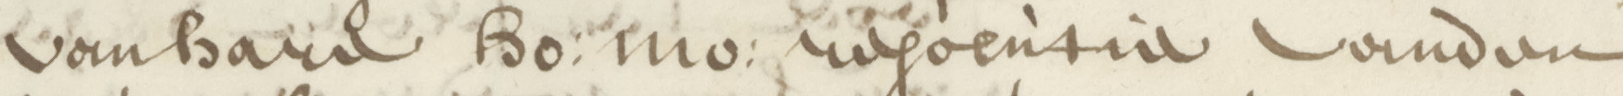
van hare Ho:Mo: resolutie vanden
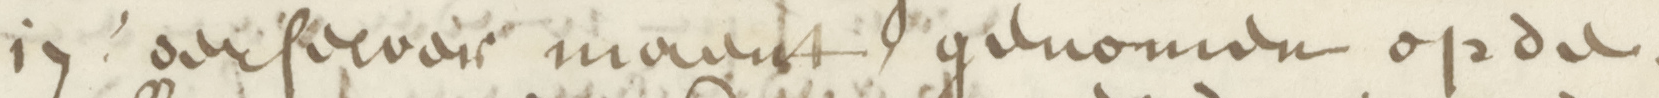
17’. derselver maent genomen op de
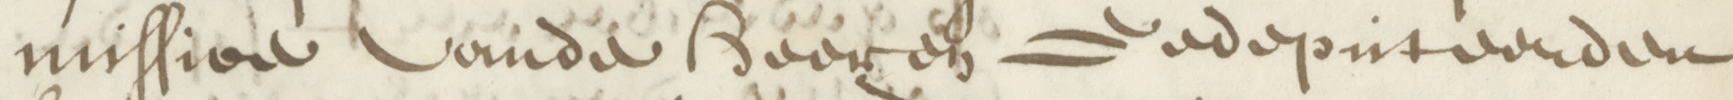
missive vande Heeren Gedeputeerden
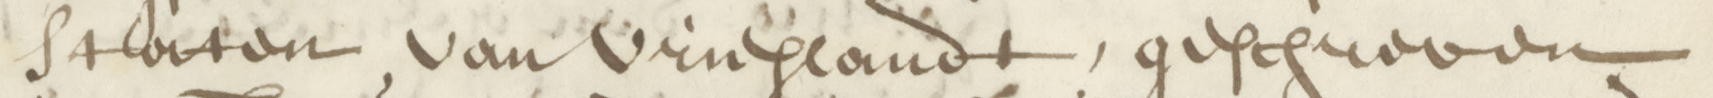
Staten van Vrieslandt, geschreven
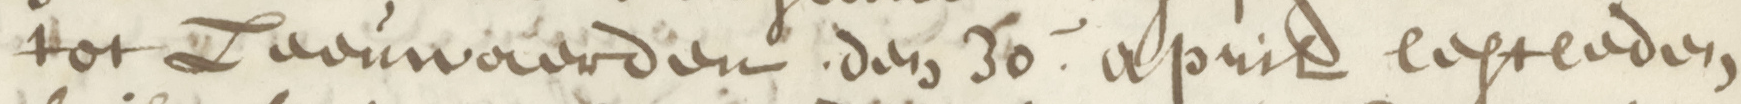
tot Leeuwaerden, den 30e. april lestleden
